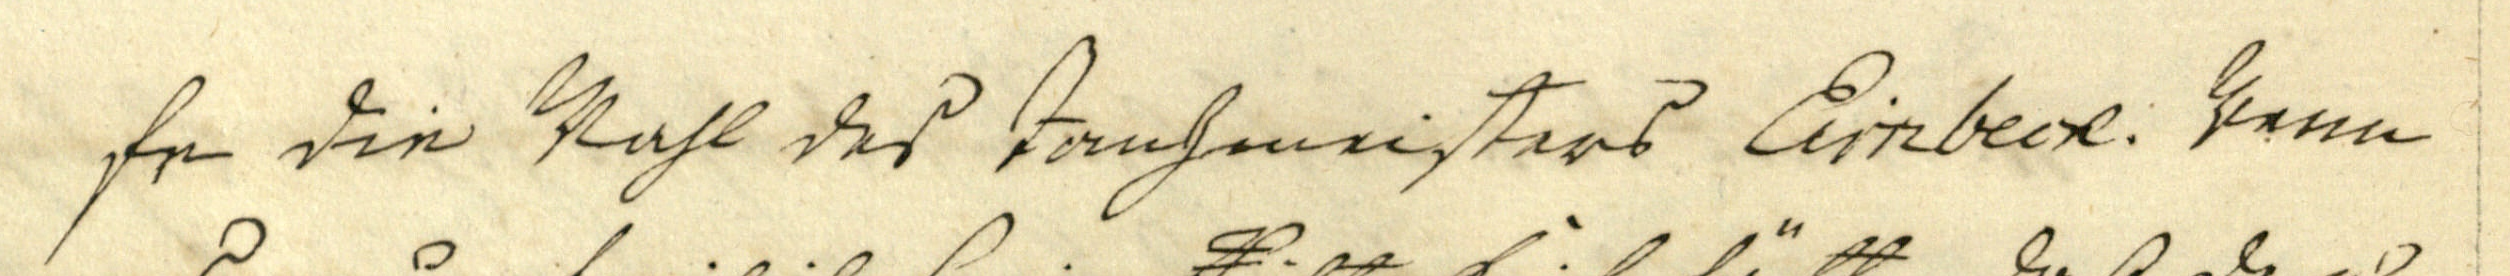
fe die Wahl des Tanzmeisters Eimbeck. Wenn
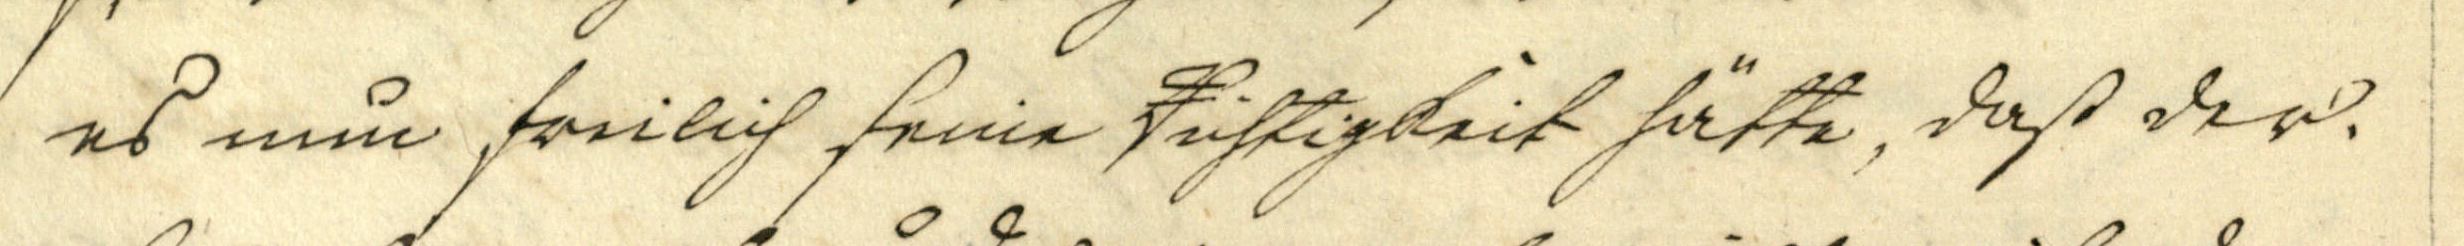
es nun freilich seine Richtigkeit hätte, daß der¬
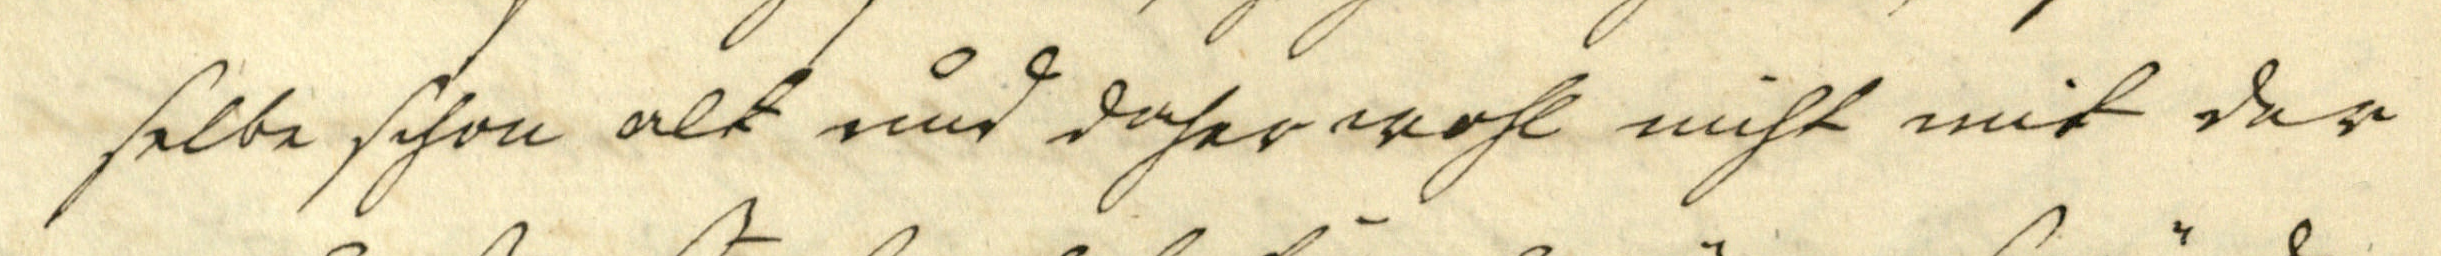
selbe schon alt und daher wohl nicht mit der
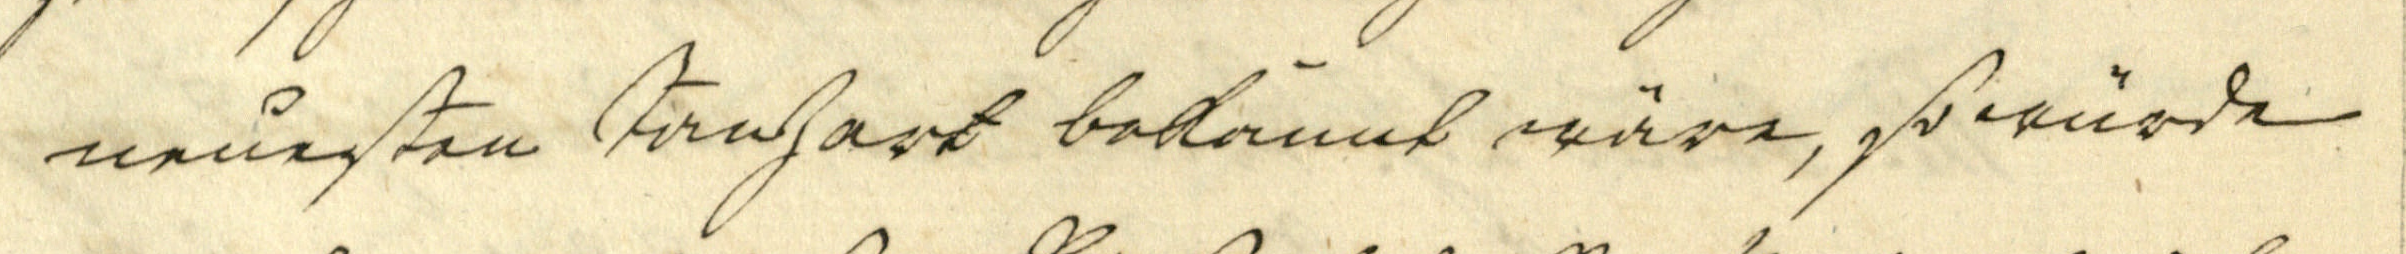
neuesten Tanzart bekannt wäre, so würde
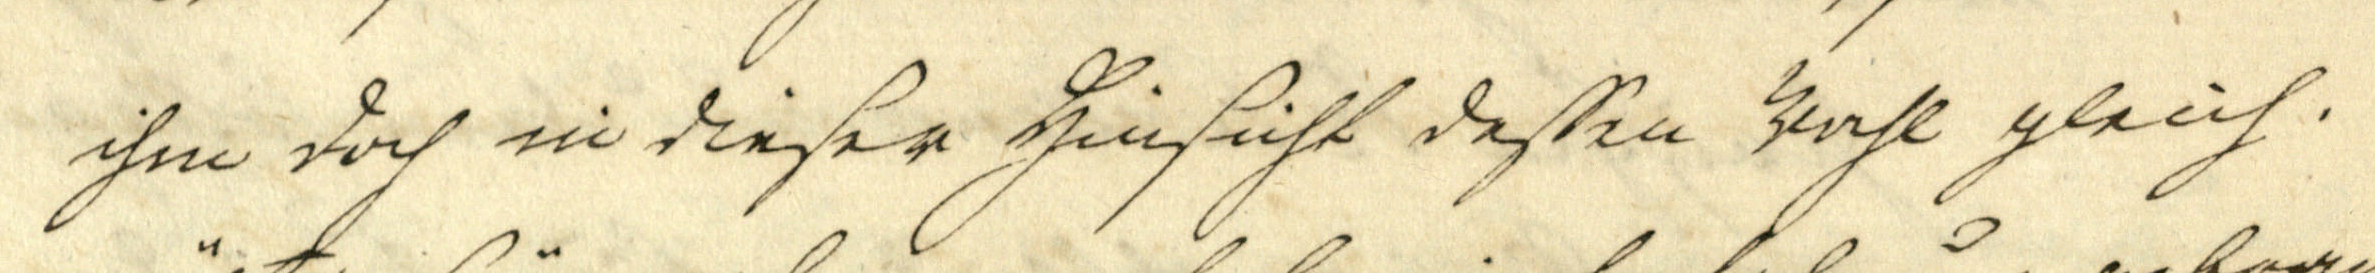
ihm doch in dieser Hinsicht dessen Wahl gleich¬
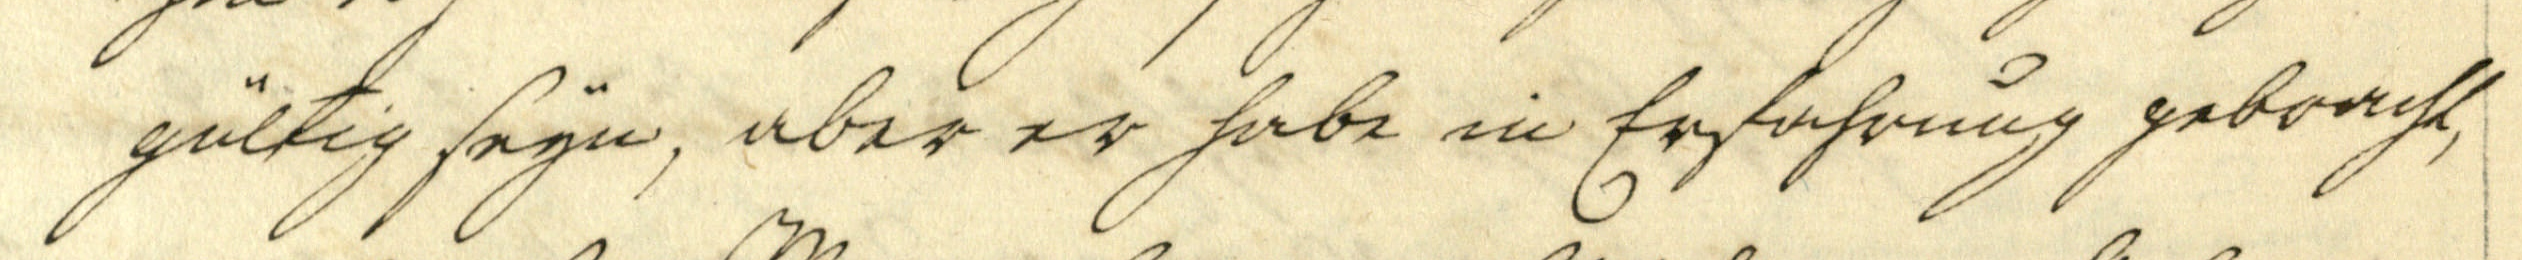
gültig seÿn, aber er habe in Erfahrung gebracht,
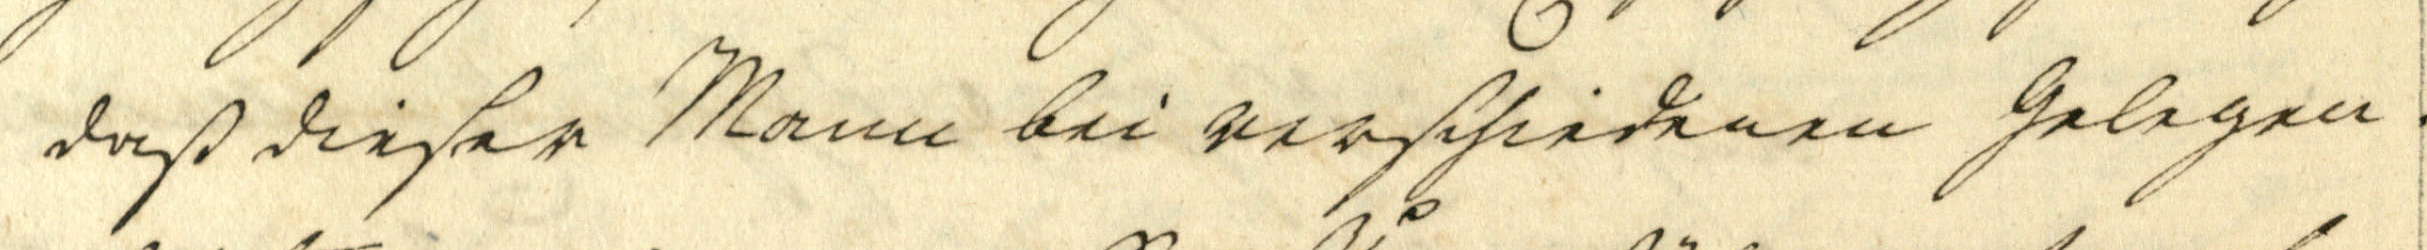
daß dieser Mann bei verschiedenen Gelegen¬
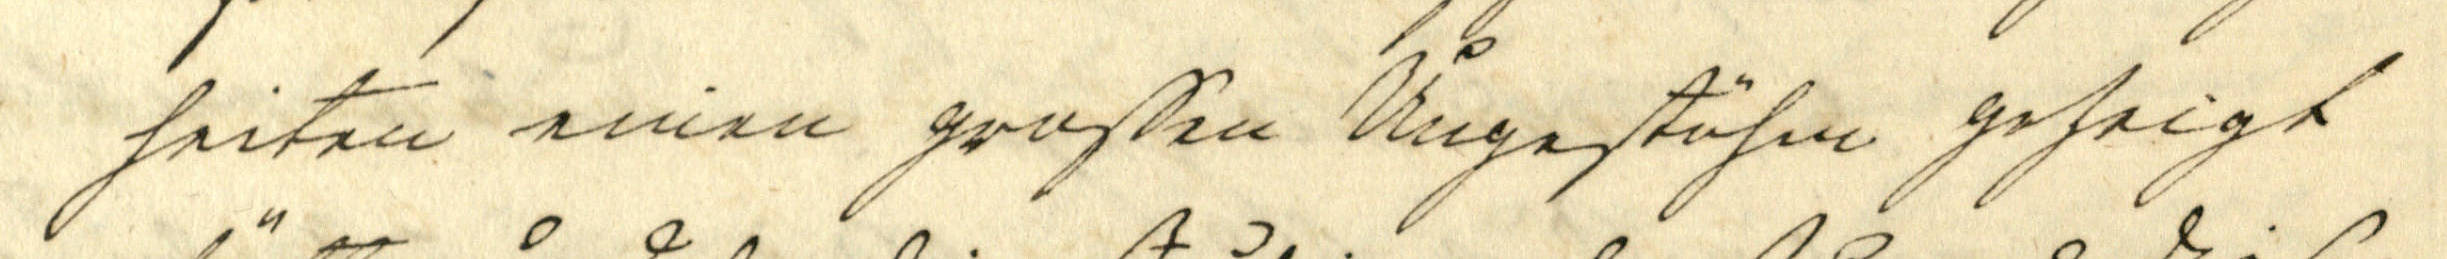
heiten einen grossen Ungestühm gezeigt
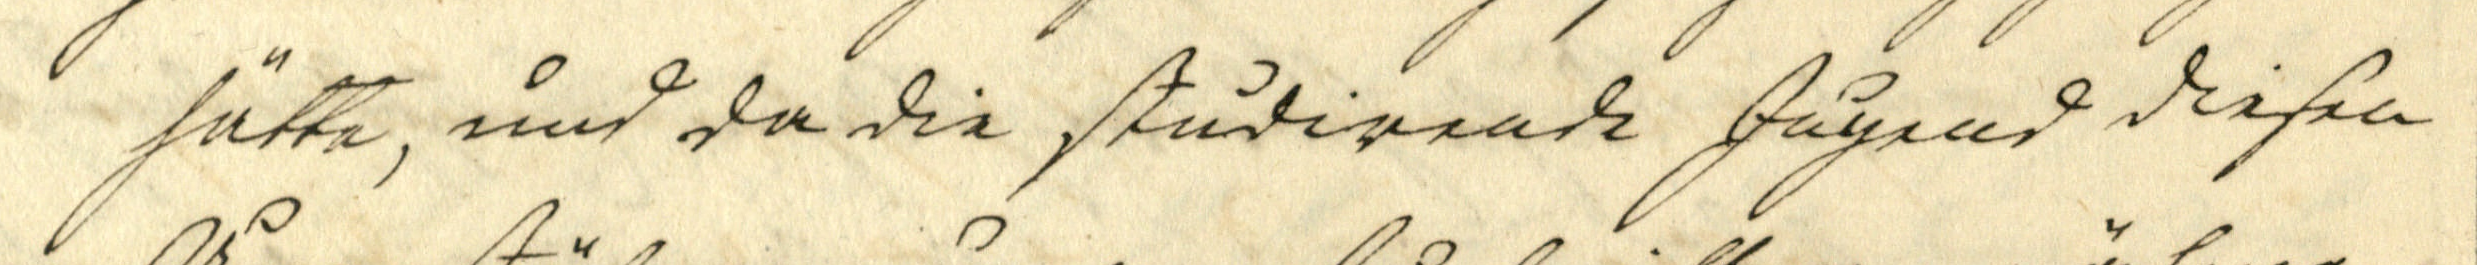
hätte und da die studirende Jugend diesen
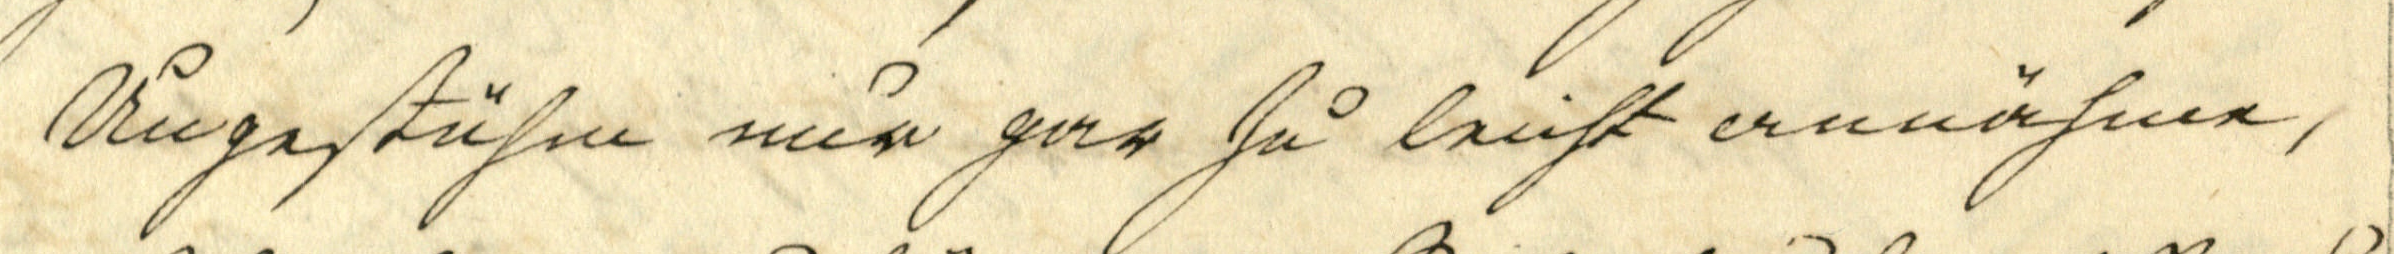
Ungestühm nur gar zu leicht amnähme,
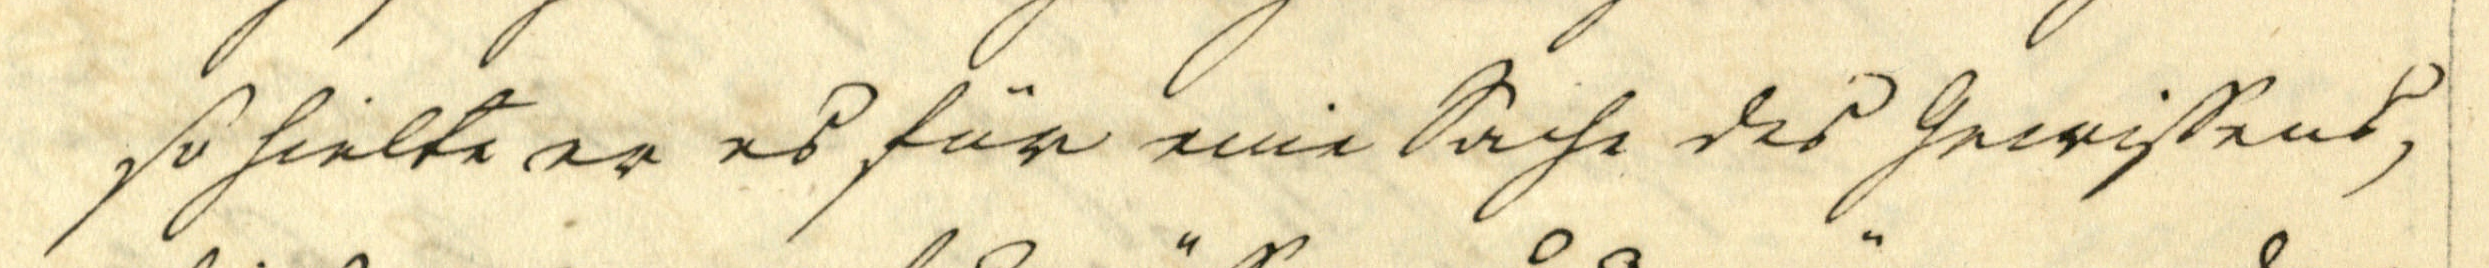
so hielte er es für eine Sache des Gewissens,
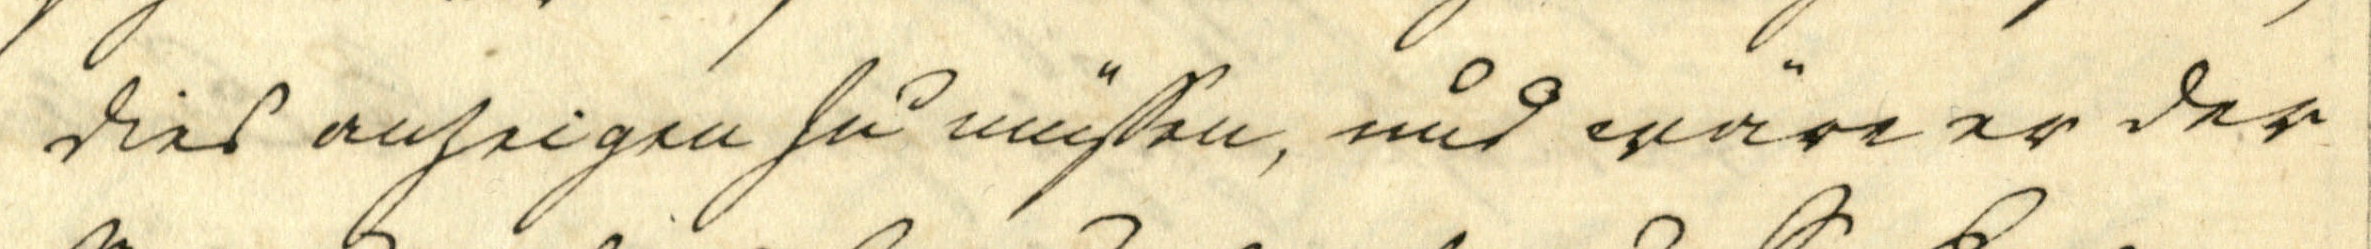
dies anzeigen zu müssen, und wäre er der
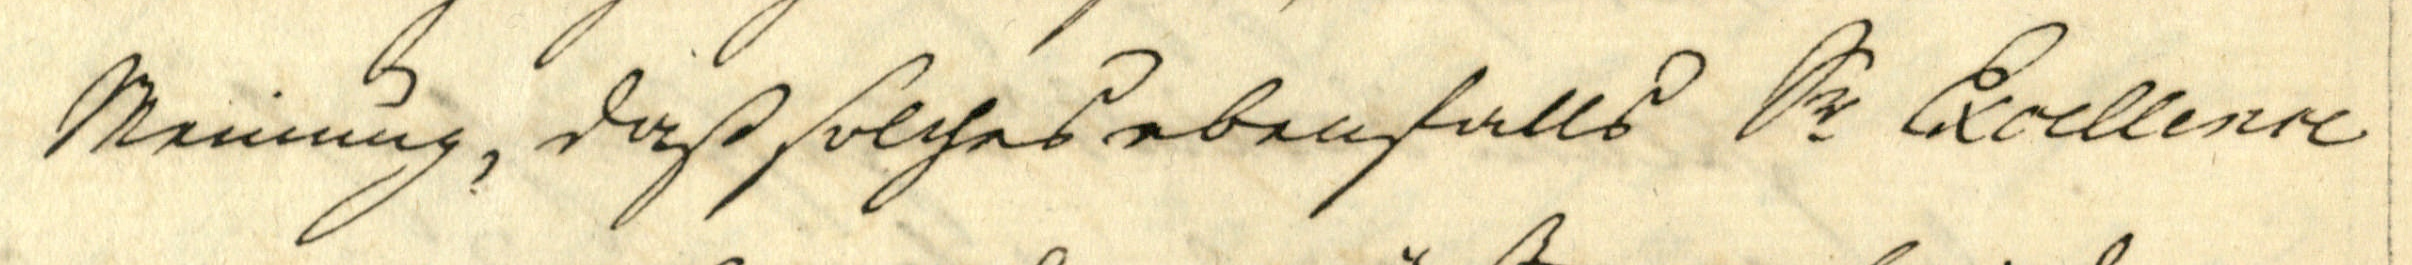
Meinung, daß solches ebenfalls Sr Excellence
